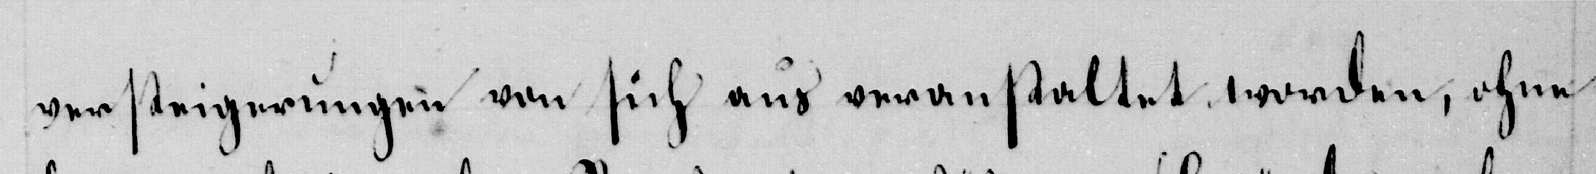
versteigerungen von sich aus veranstaltet worden, ohne
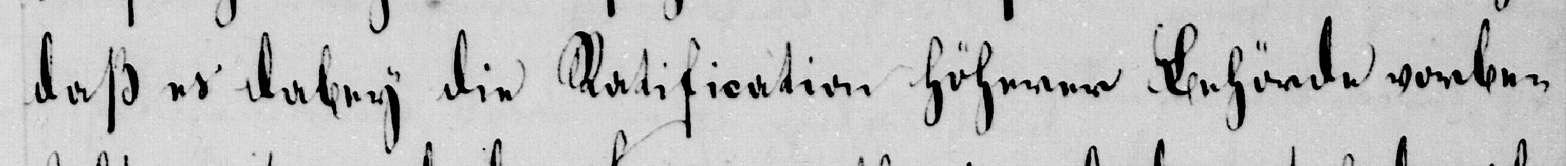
daß es dabey die Ratification höherer Behörde vorbe¬
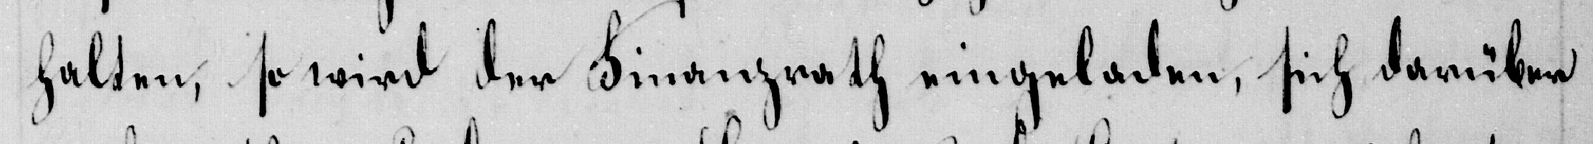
halten, so wird der Finanzrath eingeladen, sich darüber
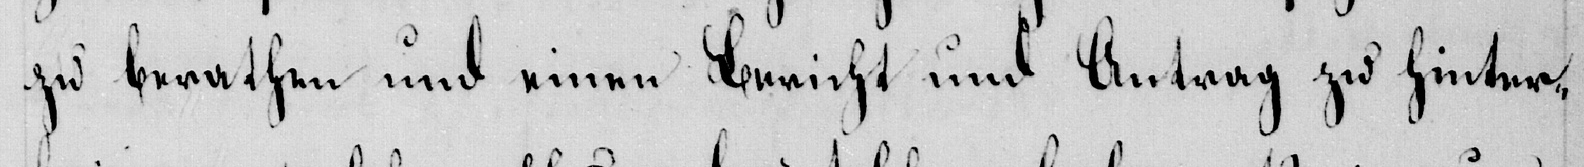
zu berathen und einen Bericht und Antrag zu hinter¬
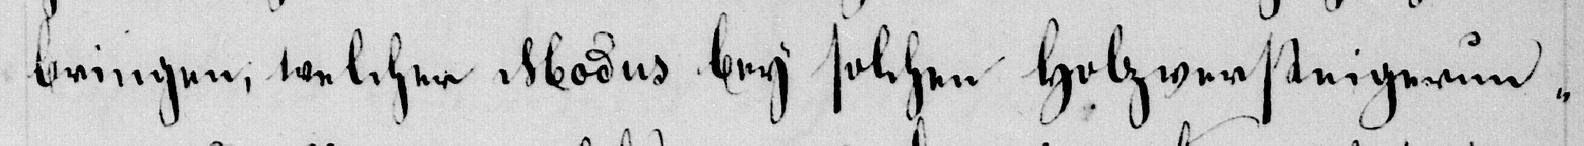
bringen, welcher Modus bey solchen Holzversteigerun¬
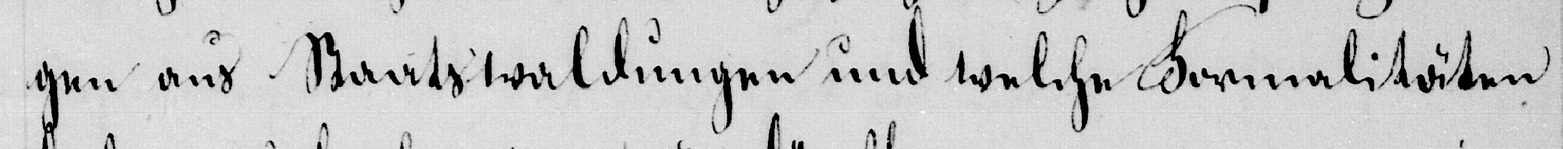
gen aus Staatswaldungen und welche Formalitäten
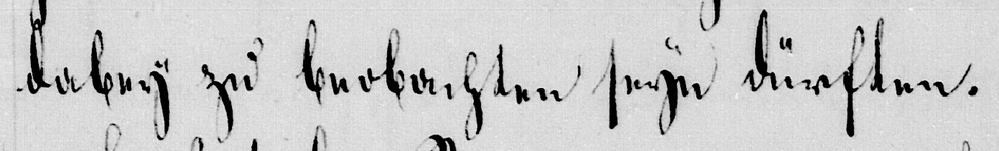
dabey zu beobachten seyn dürften.
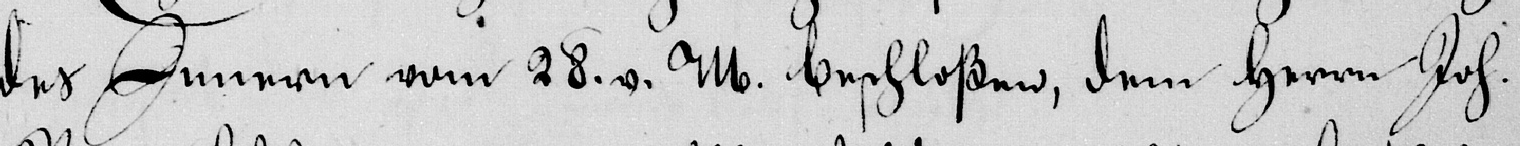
des Innern vom 28. v. M. beschloßen, dem Herrn Joh.
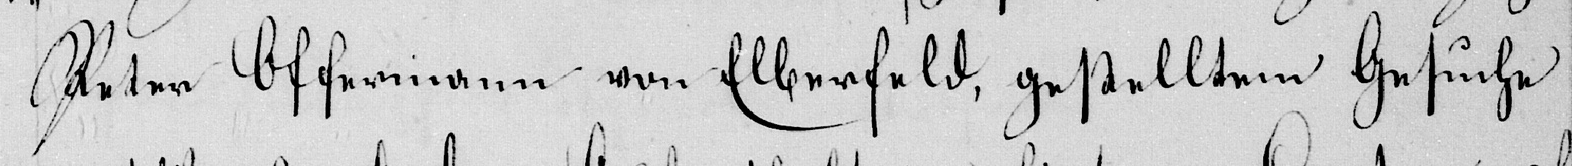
Peter Offermann von Elberfeld, gestelltem Gesuche
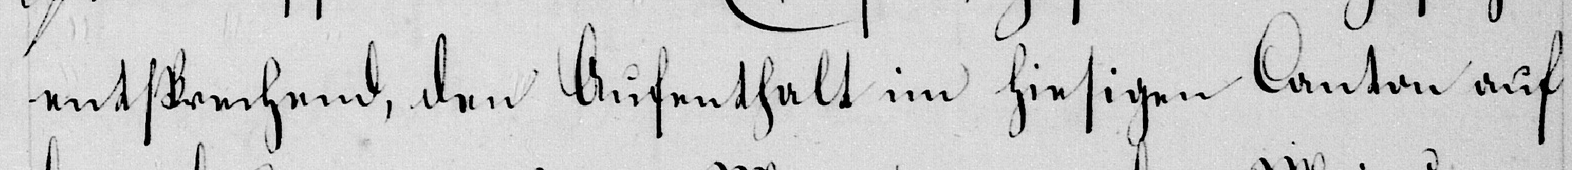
entsprechend, den Aufenthalt im hiesigen Canton auf
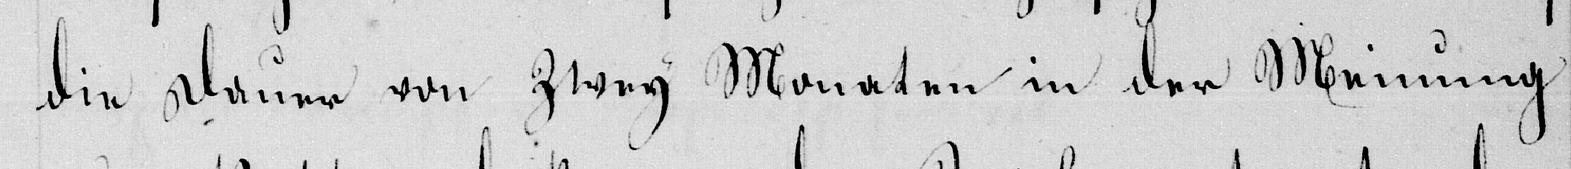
die Dauer von zwey Monaten in der Meinung
